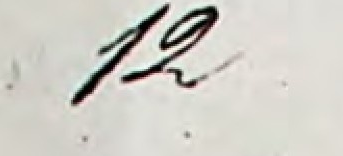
12
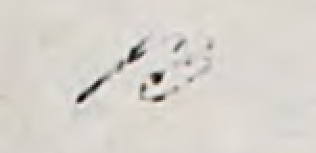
13
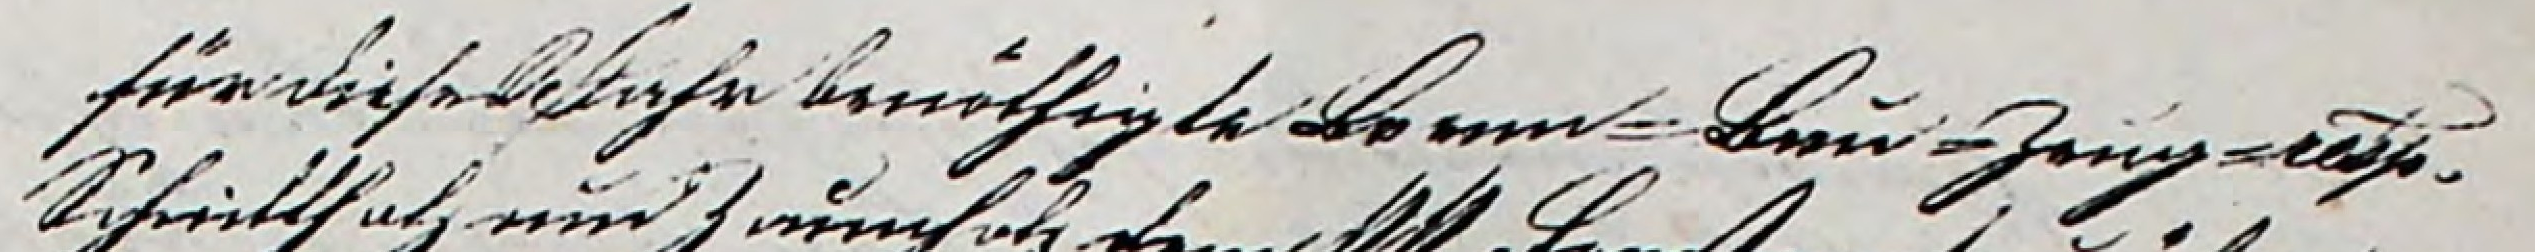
für dieses Jahr benöthigte Brenn=Bau=Zeug=resp.
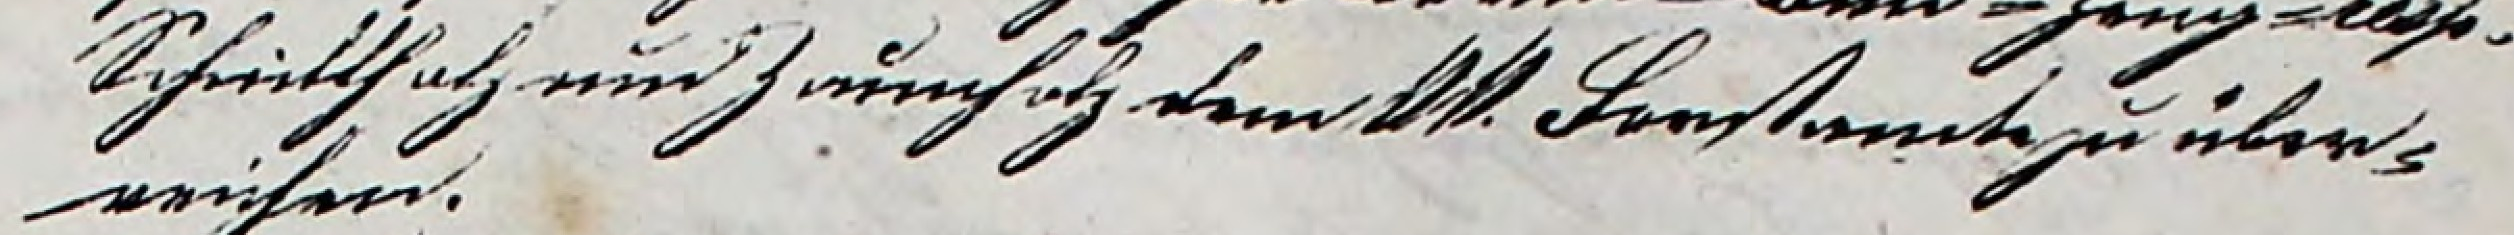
Schnittholz und Zaunholz dem kk. Forstamte zu über„
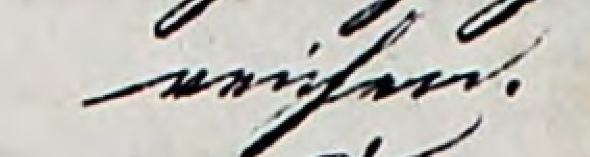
reichen.
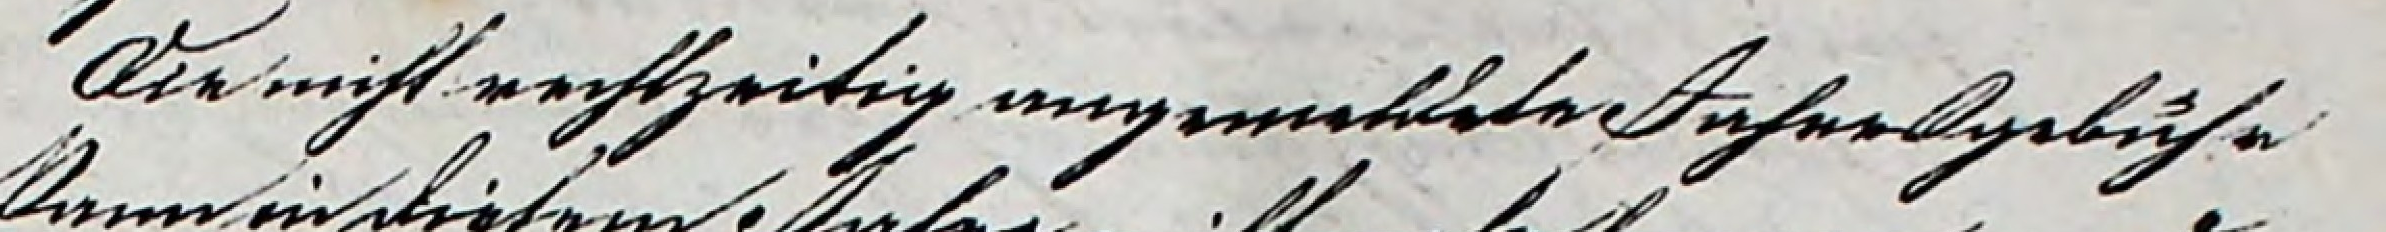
Die nicht rechtzeitig angemeldete Jahresgebühr
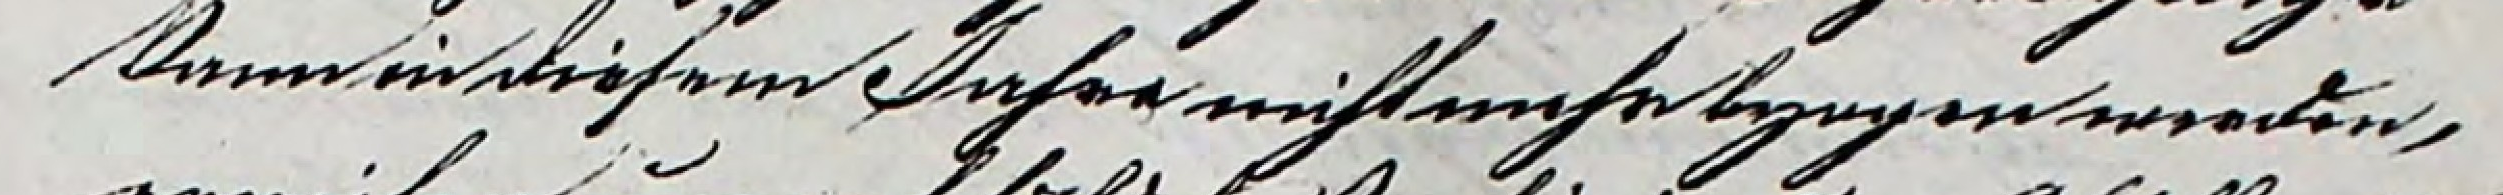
kann in diesem Jahre nicht mehr bezogen werden,
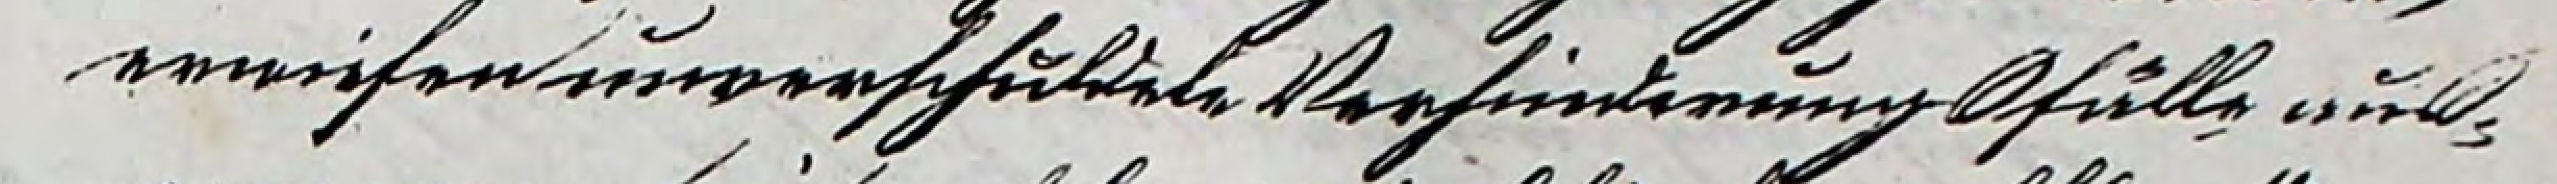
erwiesen unverschuldete Verhinderung O fälle aus„
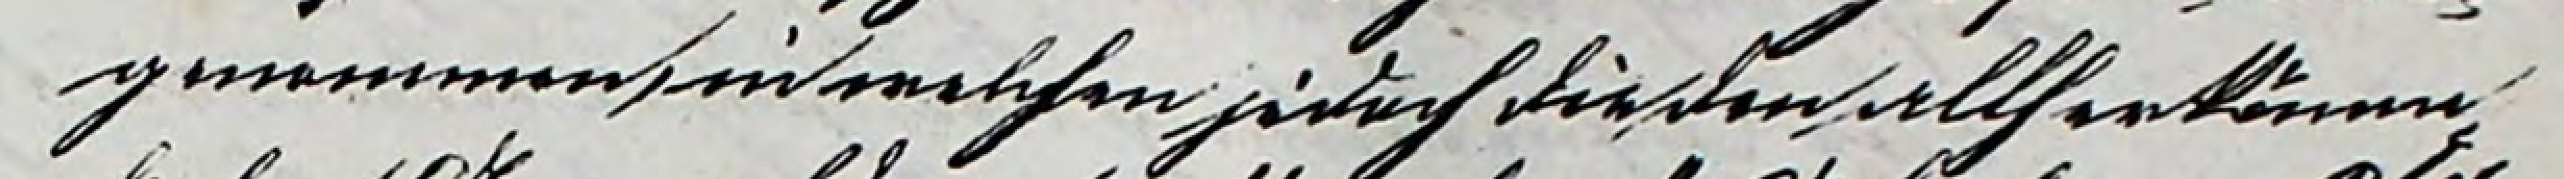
genommen, in welchen jedoch die den allherkömm„
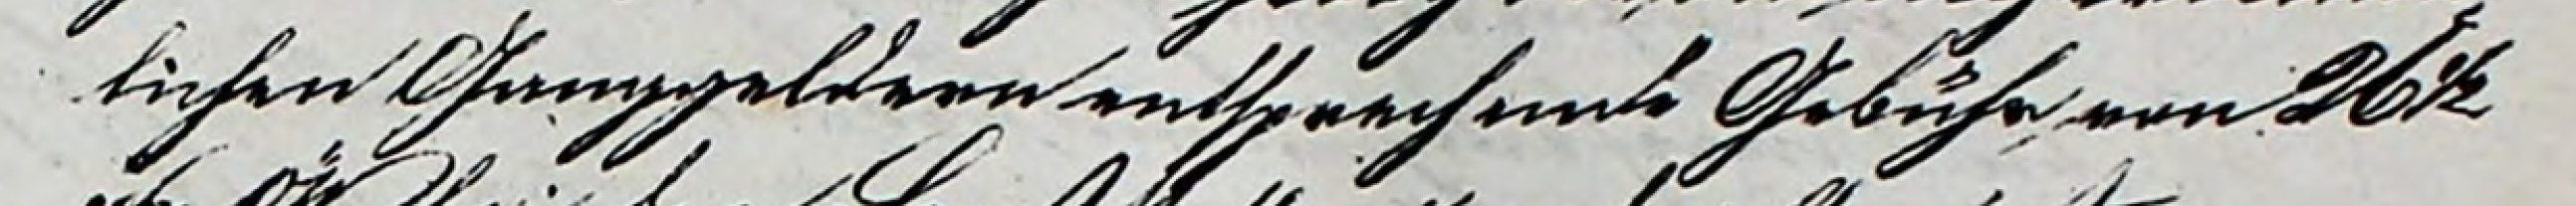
lichen Ganggeldern entsprechende Gebühr von 26 ½
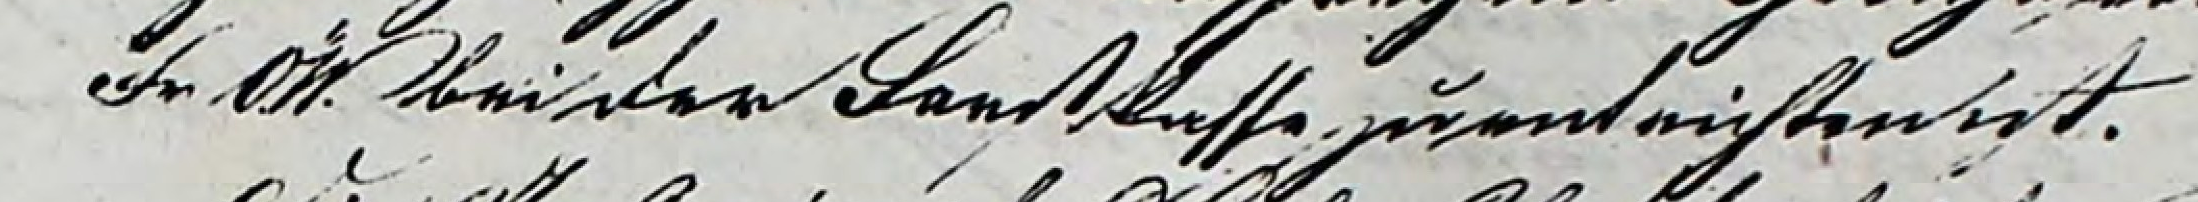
Fr Ö.W. bei der Forstkasse zu ent eichten ist.
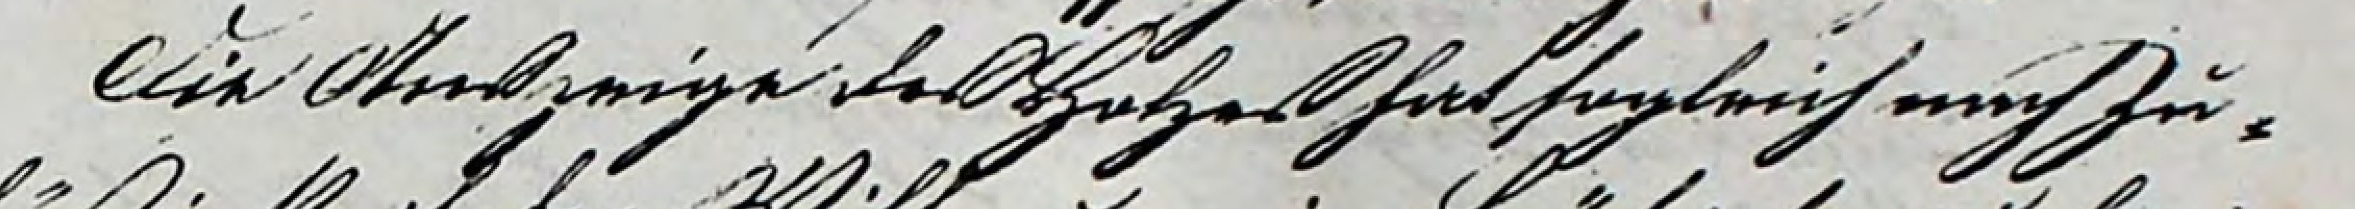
Die Auszeige des Holzes hat sogleich nach Zu„
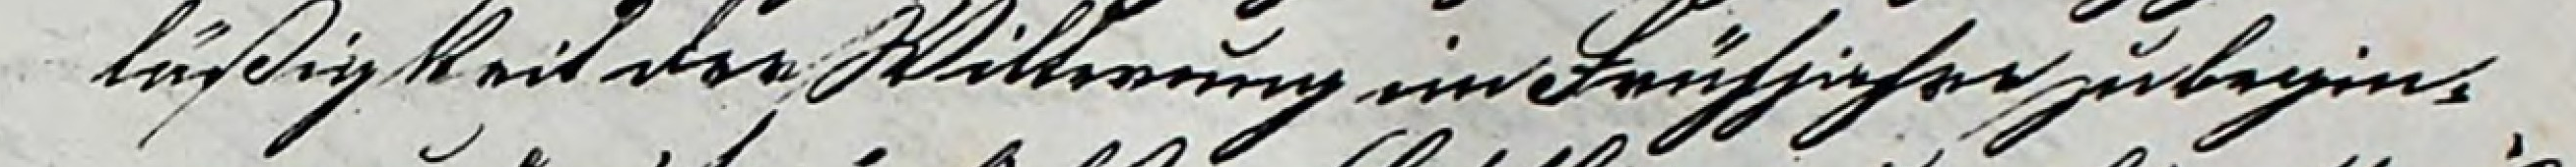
läßig keit der Witterung im Frühjahre zu begin„
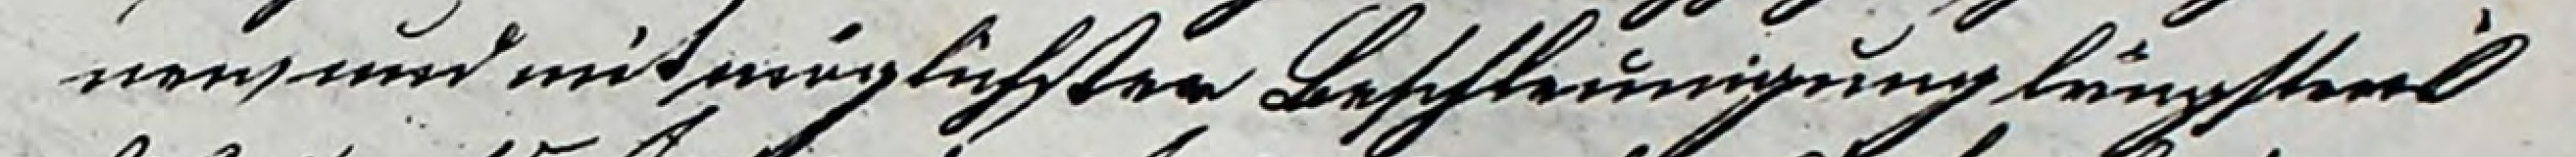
nen, und mit möglichster Beschleunigung längstens
